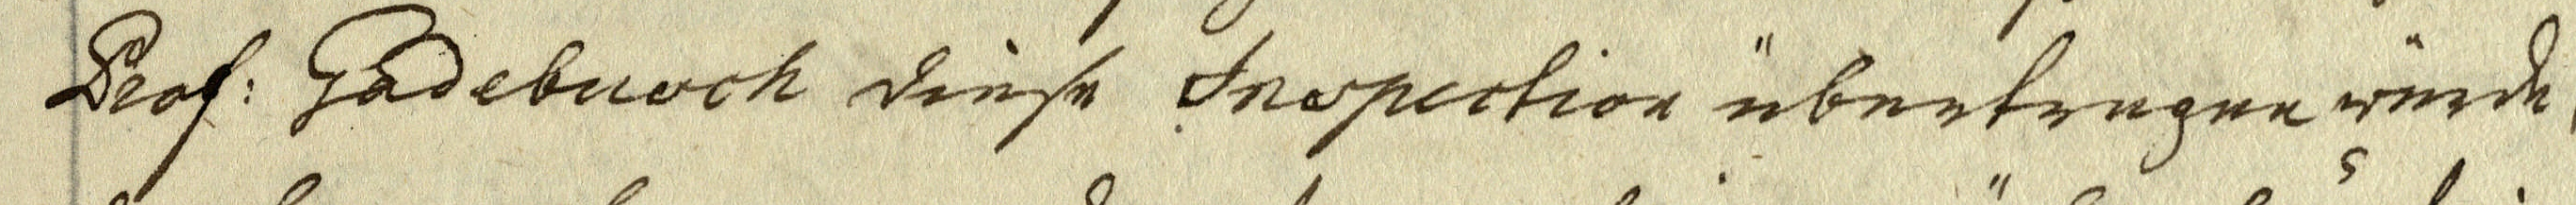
Prof. Gadebusch diese Inspection übertragen würde,
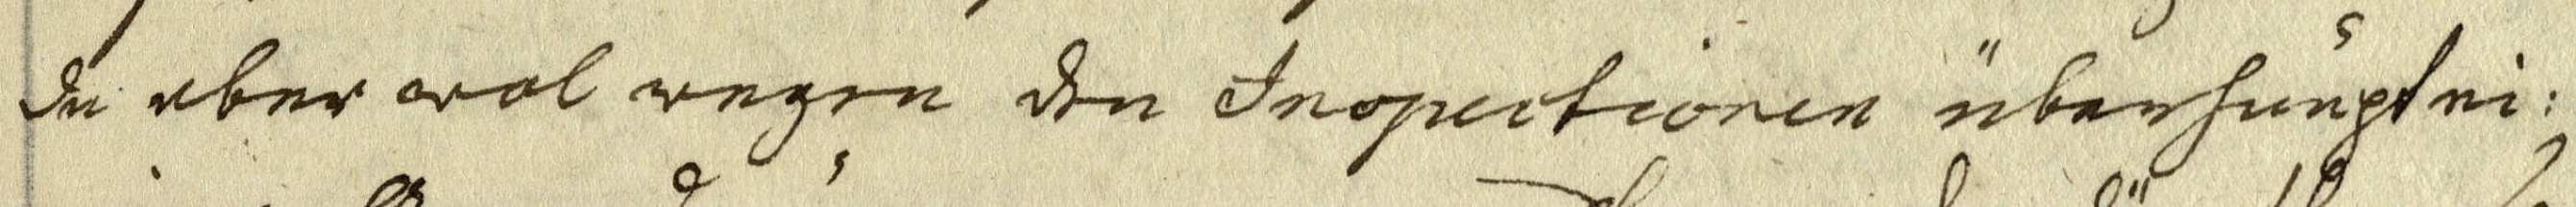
da aber wol wegen den Inspectionen überhaupt ei¬
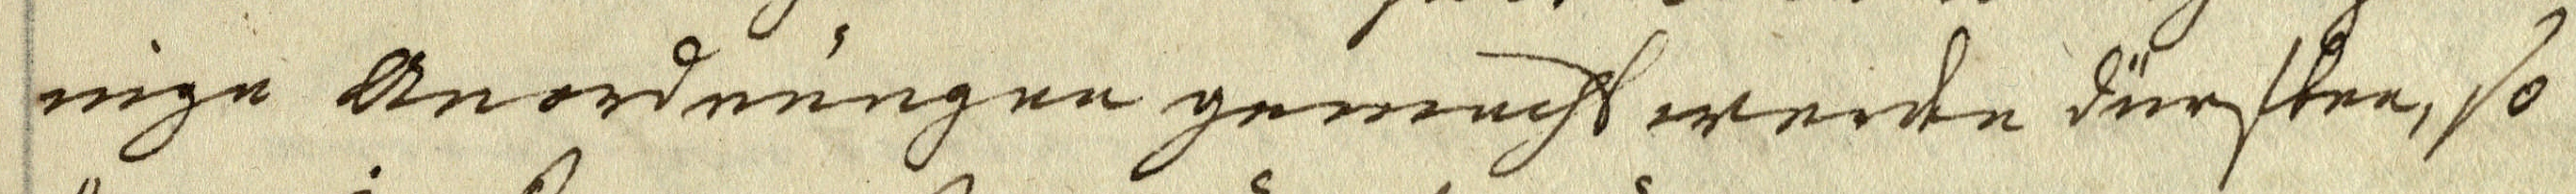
nige Anordnungen gemacht werden dürften, so
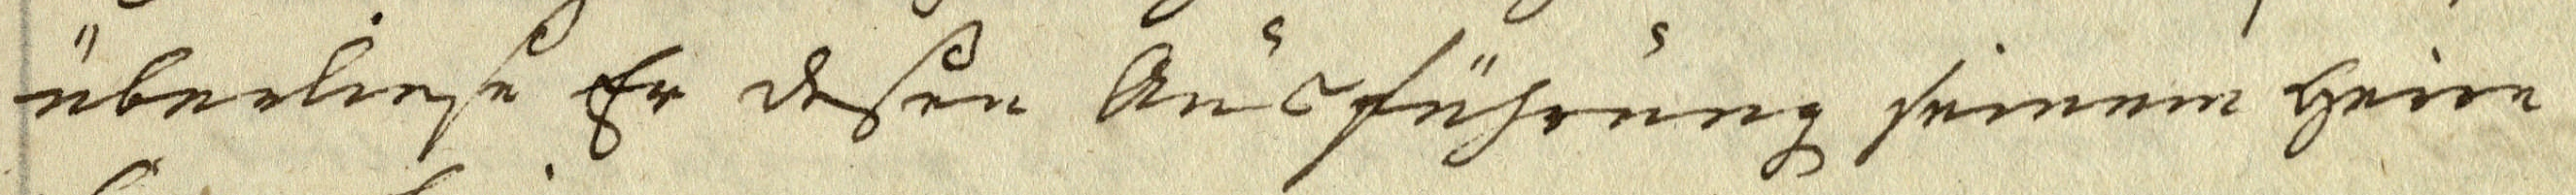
überließe Er deßen Ausführung seinem Herrn
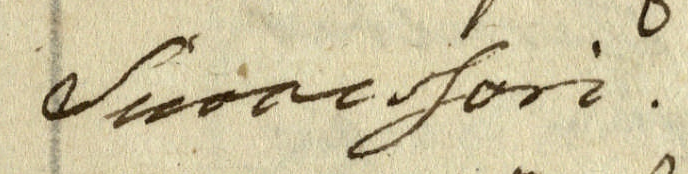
Successori.
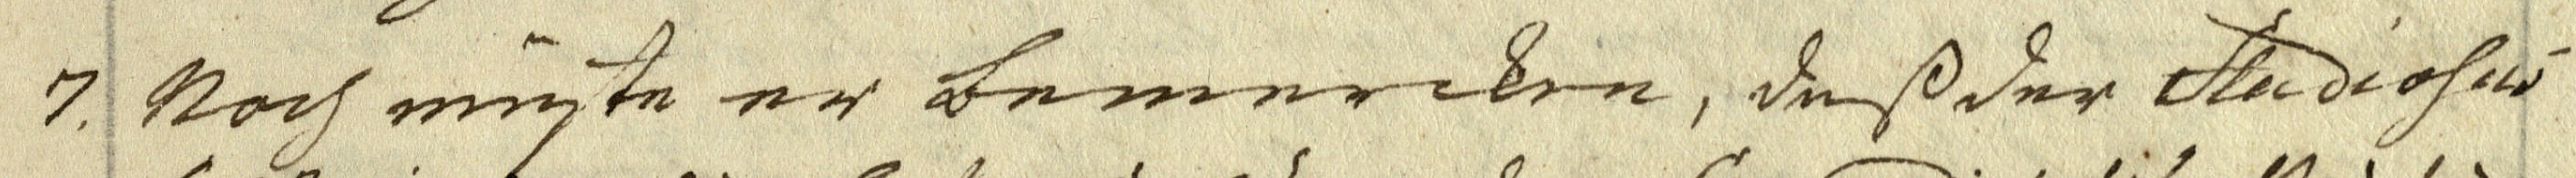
7. Noch müste er bemercken, daß der Studiosus
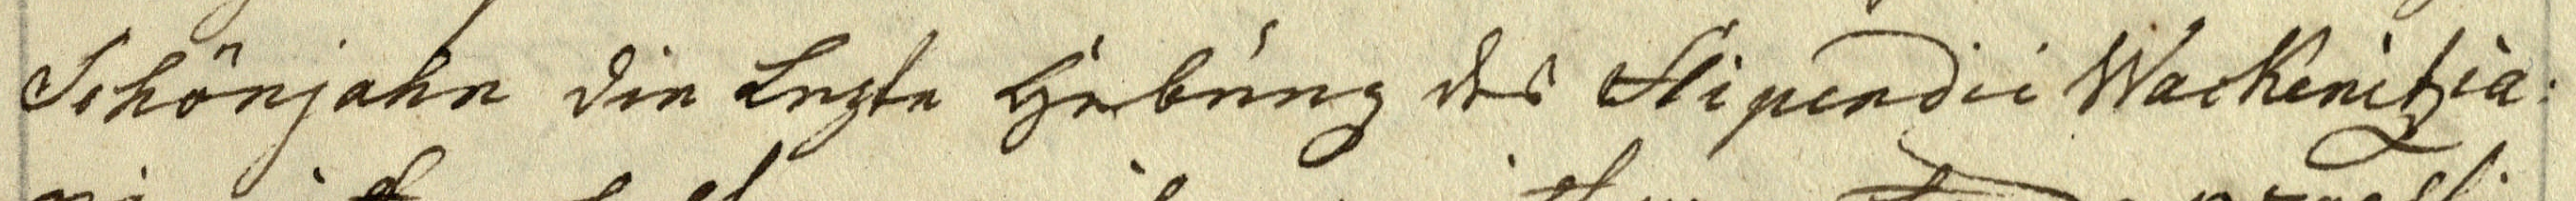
Schönjahn die lezte Hebung des Stipendii Wackenitzia¬
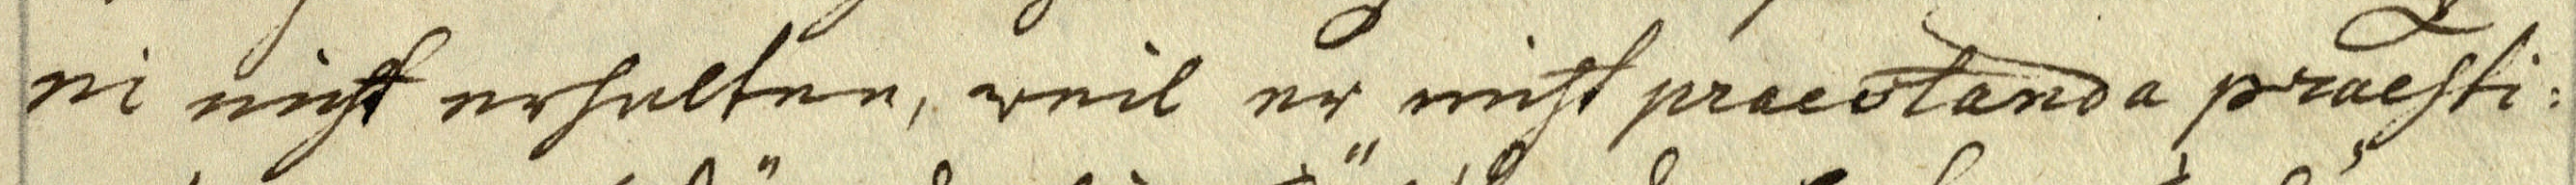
ni nicht erhalten, weil er nicht praestanda praesti¬
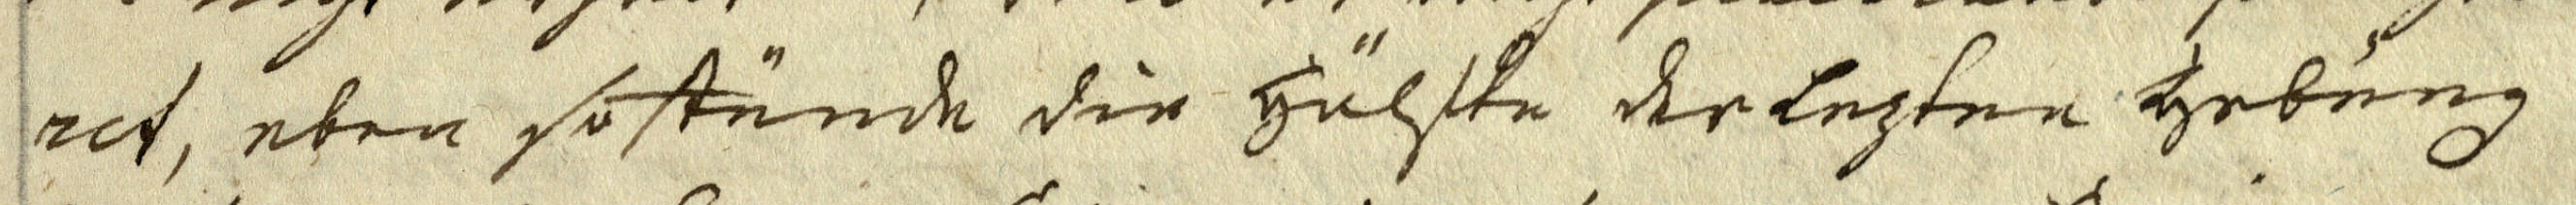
ret, ebenso stünde die Hälfte der leztern Hebung
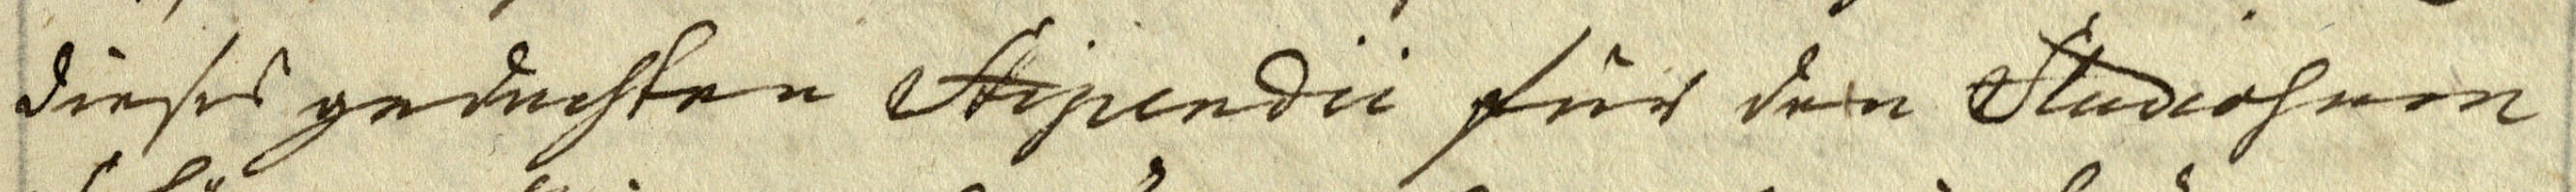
dieses gedachten Stipendii für den Studiosum
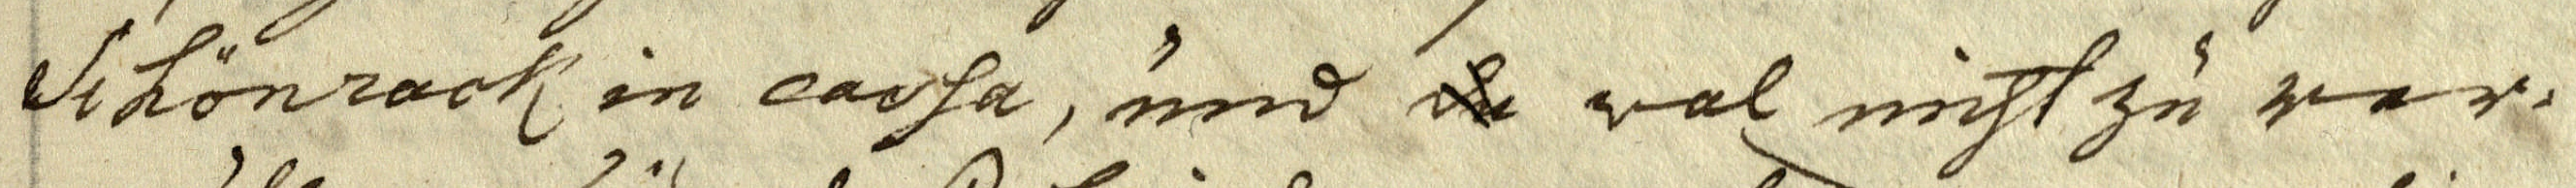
Schönrock in cassa, und da wol nicht zu ver¬
